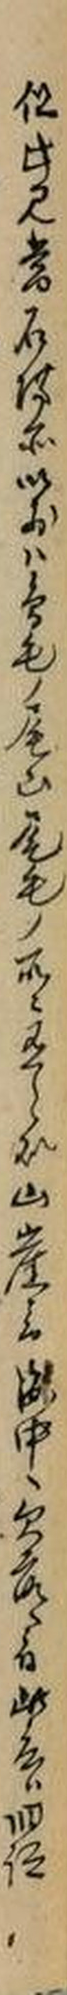但此見当石場所以前ハ鳥毛ノ尾山尾毛ノ所ニ有之候処山崖ニ而海中へ欠落候ニ付此度ハ旧跡
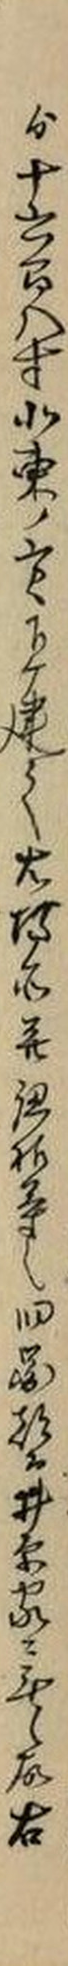ゟ十六間八寸北東ノ方へ下ケ建之右場所幷認様等之旧図都而井原家ニ無之故右
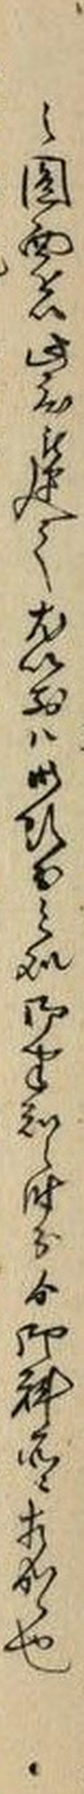之図面を以此度被建之尤以前ハ御領分之処御半知之時分ゟ御料所ニ相成候也
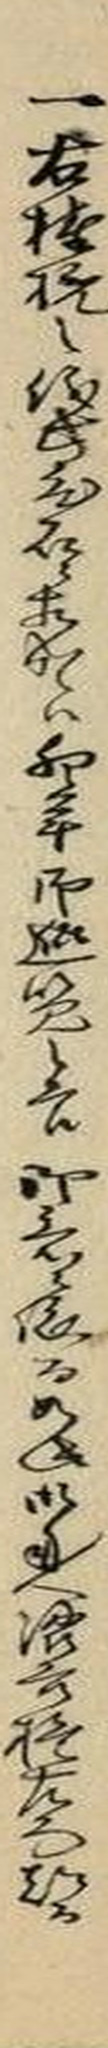一右棒杭之儀此度石ニ相成候ハ卯年御巡覧之節御意ニ依而如此御用人渋谷権左衛門都而
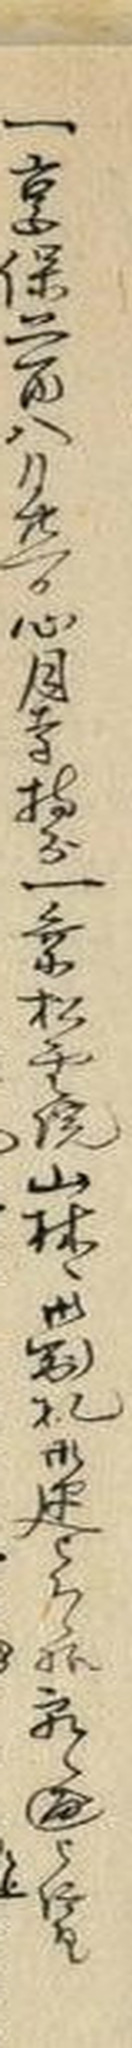一享保二酉八月廿一日心月寺持分一乗松雪院山林へ御制札御建被下候様願之通被仰付候
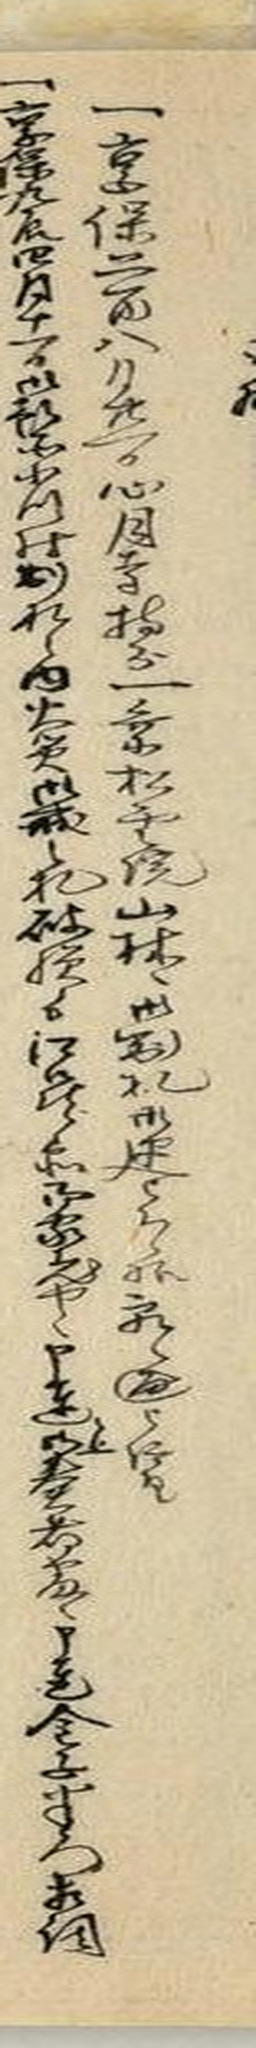一享保九辰四月十一日御預所小川村制札之内火災御戒之札破損ニ付江口次郎兵衛御家老中へ申達候上御奏者番へ申達金子半右衛門相調
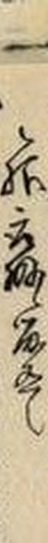候様取扱候留有之
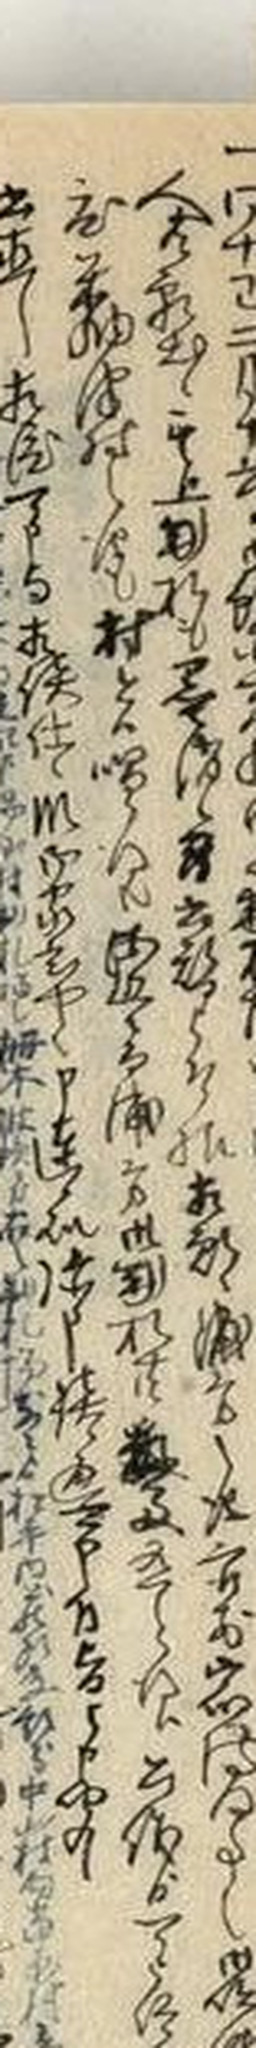書直し相渡可申与相談仕候段御家老中へ申達候処弥申談候通可申付旨被申聞候
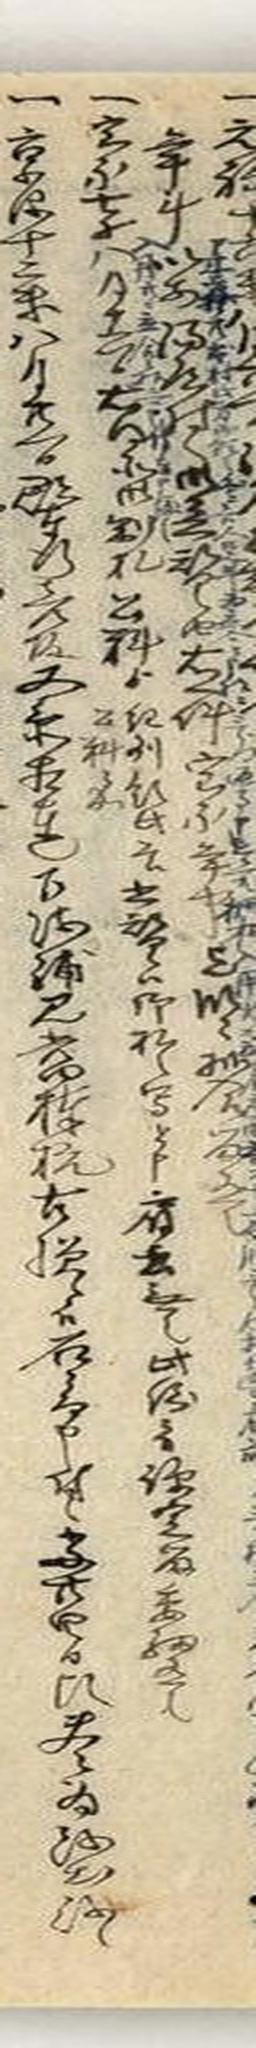一享保十二未八月廿一日郡奉行彦坂又兵衛相達下海浦見当棒杭古損候ニ付石ニ而申付候当廿四日頃夫々為致出役候
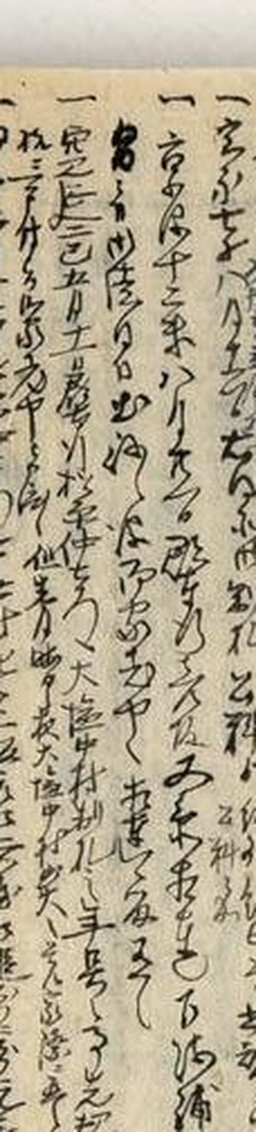旨ニ付御徒目付出役之儀御家老中へ相達候留有之
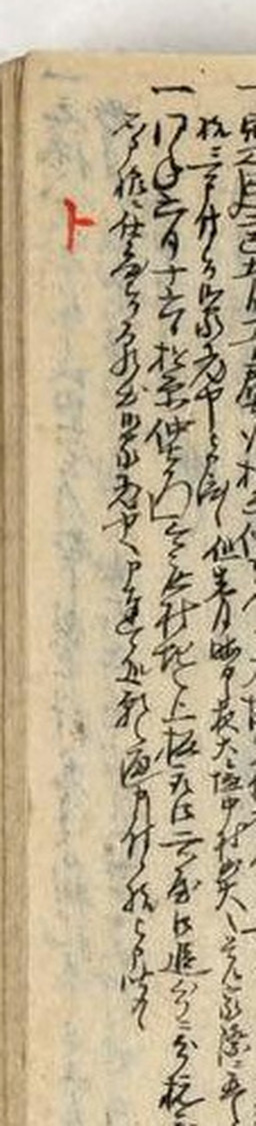不申様ニ仕度旨願出御家老中へ申達候処願之通申付候様被申聞候

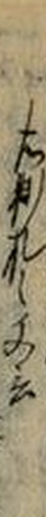右制札之文言
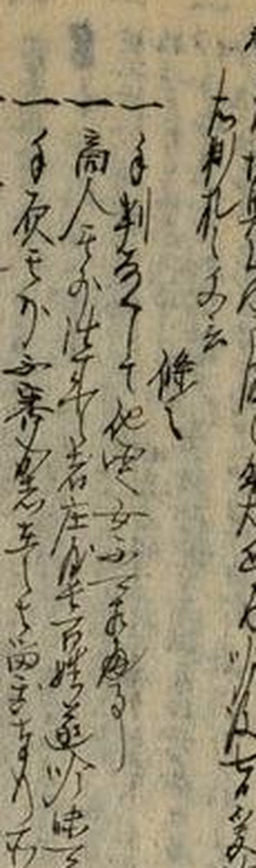一手判なくして他国へ女不可相通事
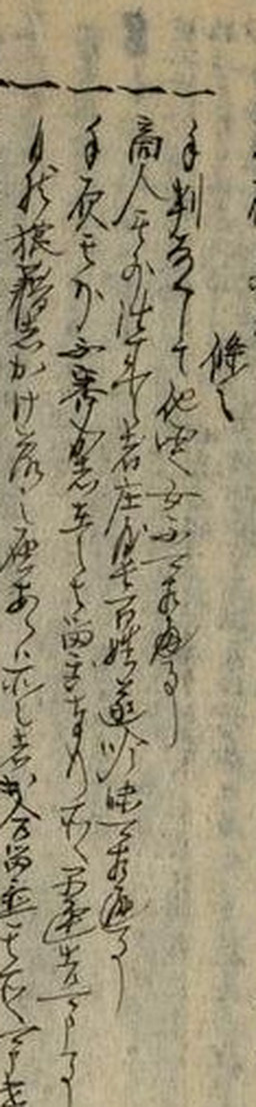一商人其外往来之者庄屋長百姓遂吟味可相通事
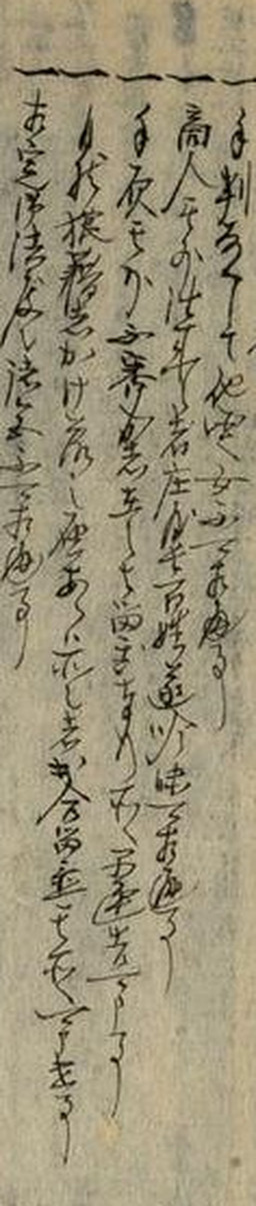一手負其外不審成者在之者留置奉行所へ早速告可申事
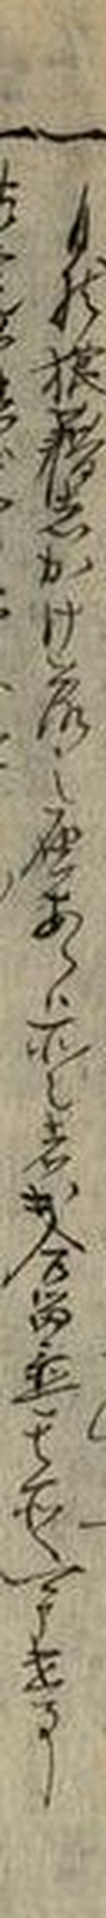一自然狼藉者かけ落之届あらハ所之者出合留置其所へ可申遣事
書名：御国他国諸事之部
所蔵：福井県文書館 Fukui Prefectural Archives
